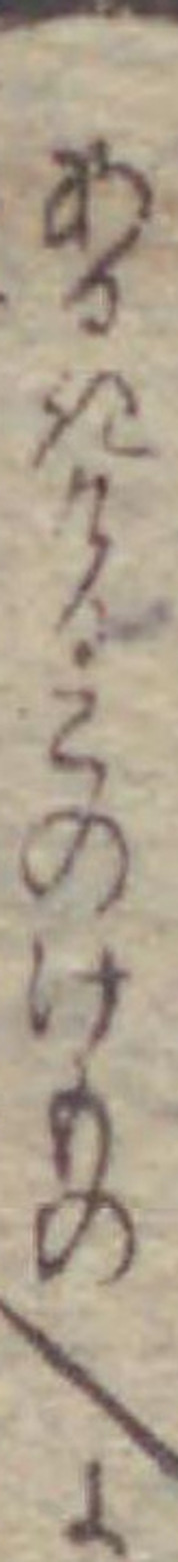あるきけるこのけものに
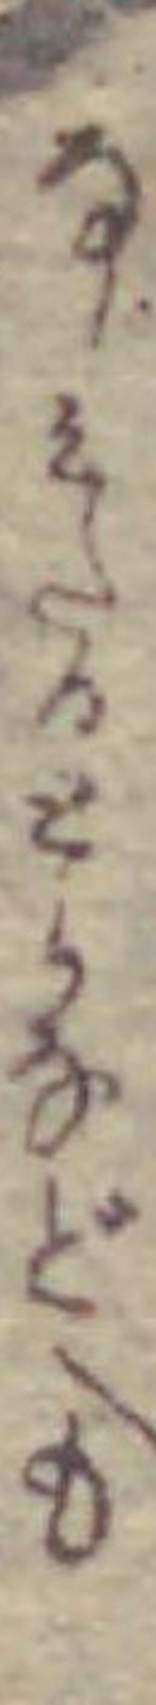なじみたるとらなども
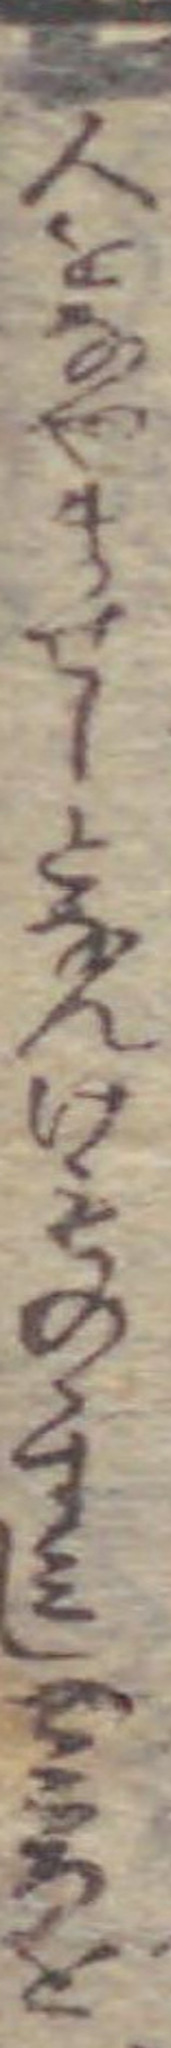人をなやませしとなんけものゝすみしところを
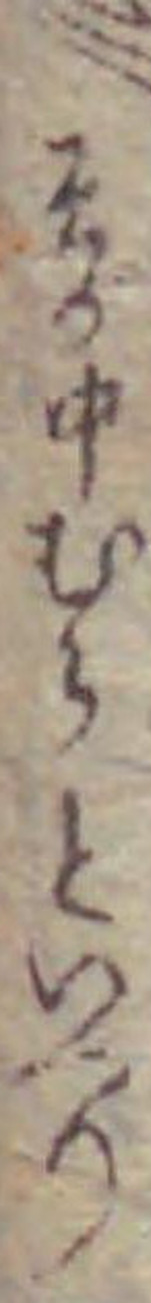そが中むらといへり
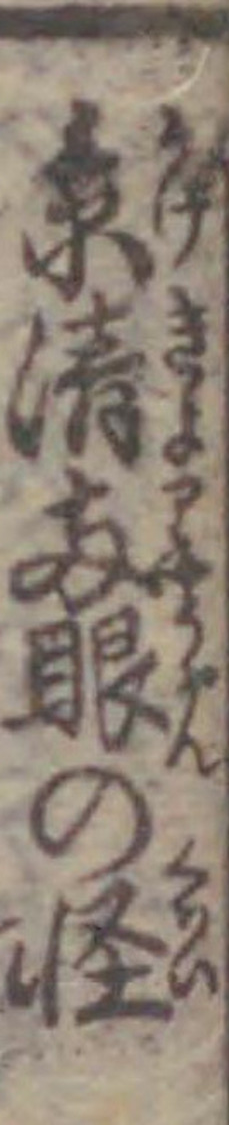景清両眼の怪
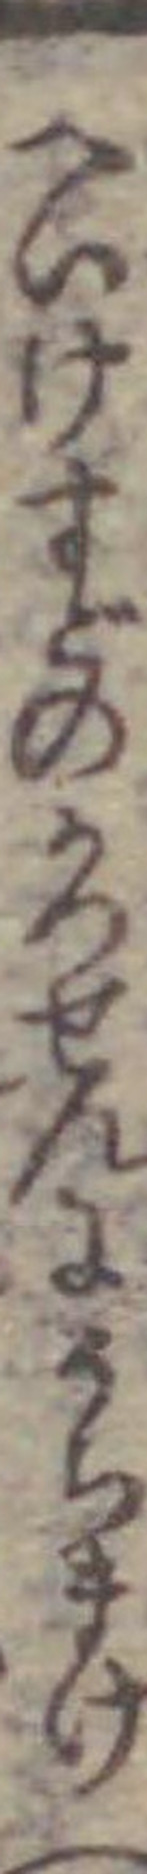へいけすどのかつせんにうちまけ
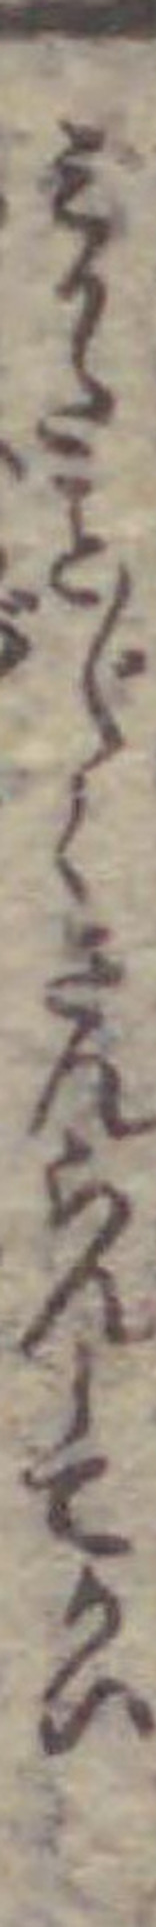みかたこと〴〵くさんらんしてかい
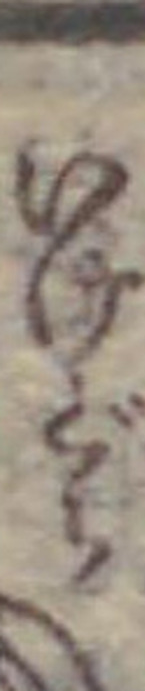いけどら
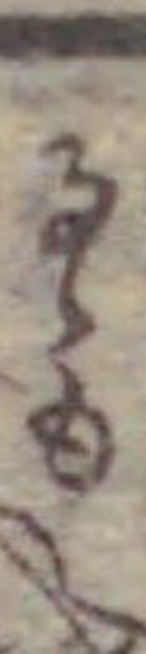るゝも
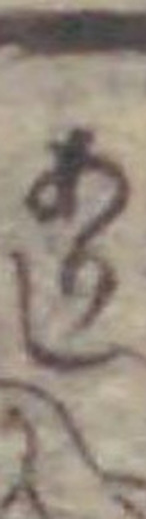ありし
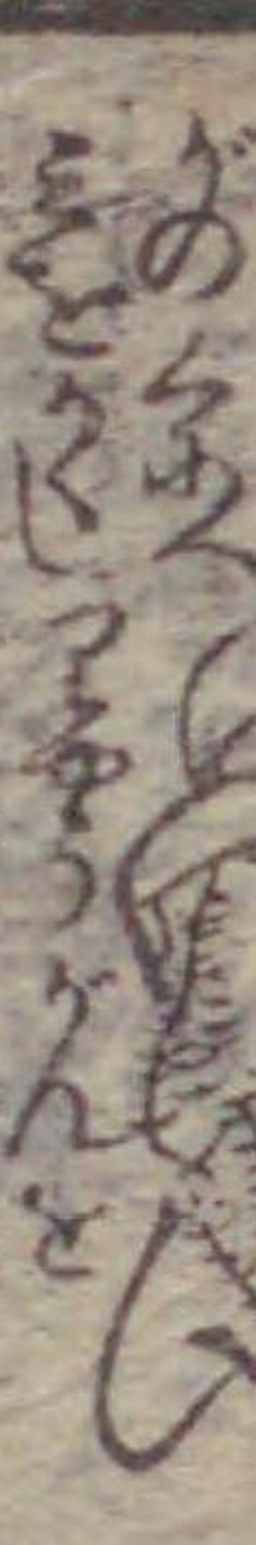みをかくしりやうがんを
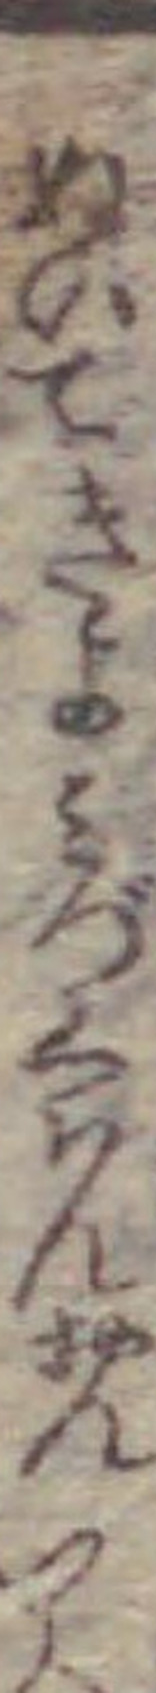ぬいてきよみづくはんおん
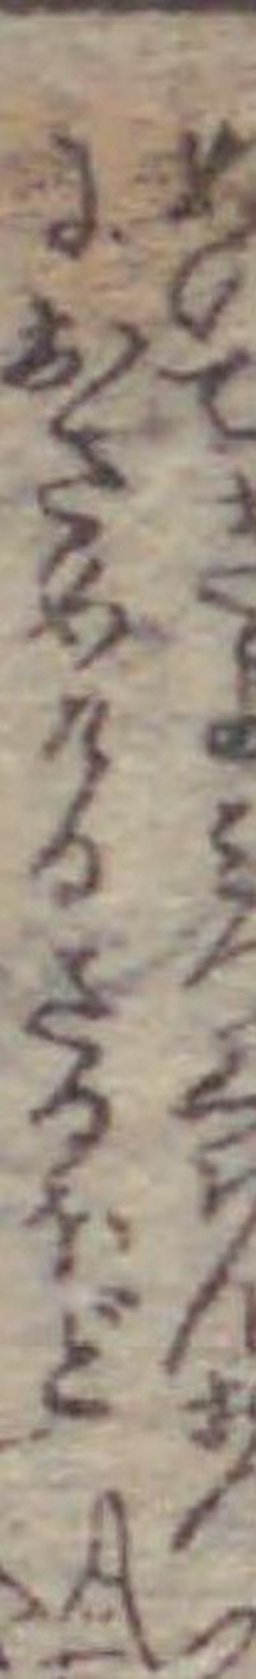におさめけるさるほど
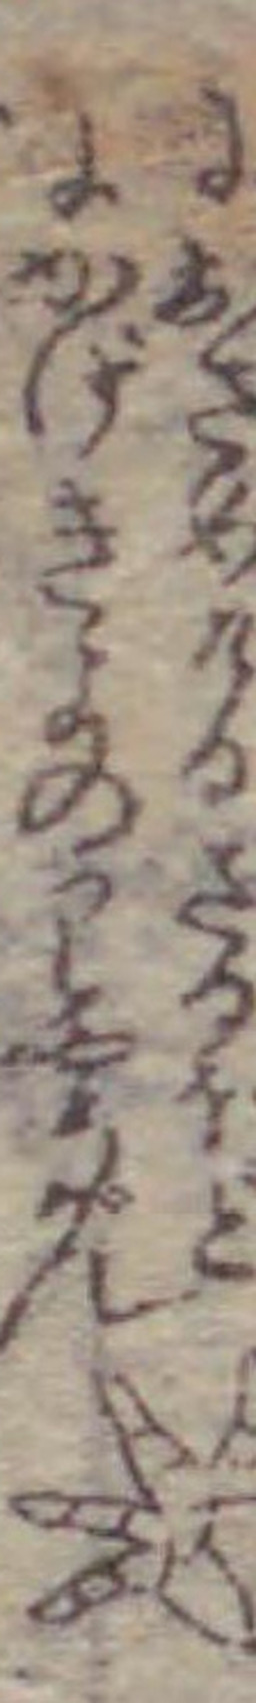にかげきよのりやうがん
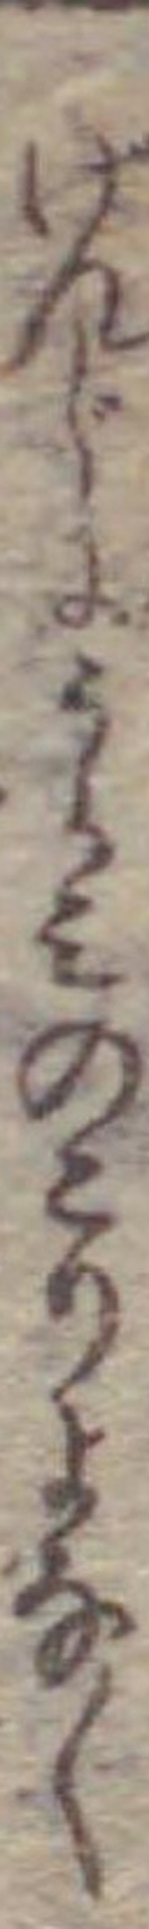げんじにうらみのこりよな〳〵
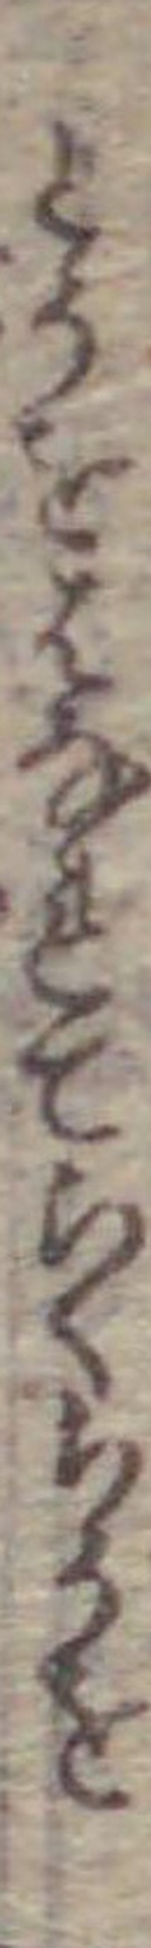とうをはなれてらくちうを
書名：武家物奇談 : 3巻
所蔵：国立国会図書館 National Diet Library, JAPAN
